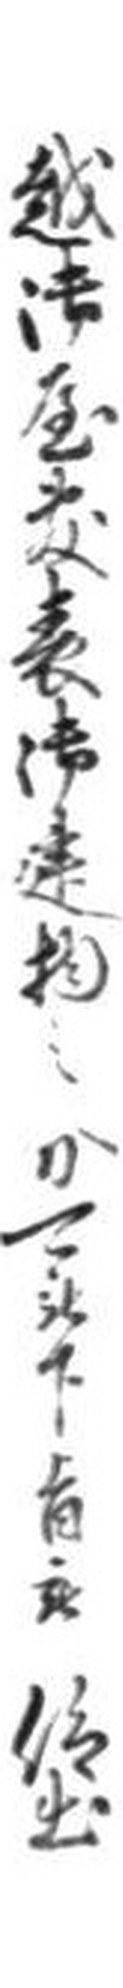越御屋敷表御建物之分可被下旨被仰出
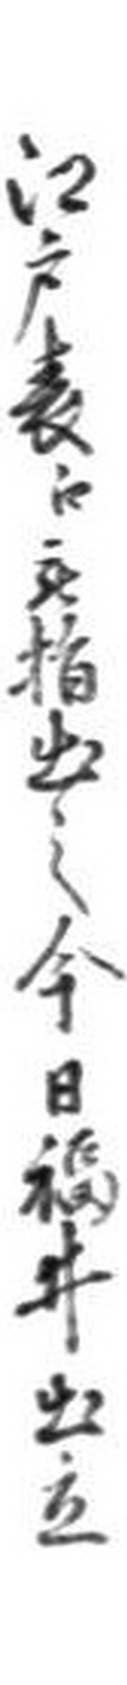江戸表江被指出之今日福井出立
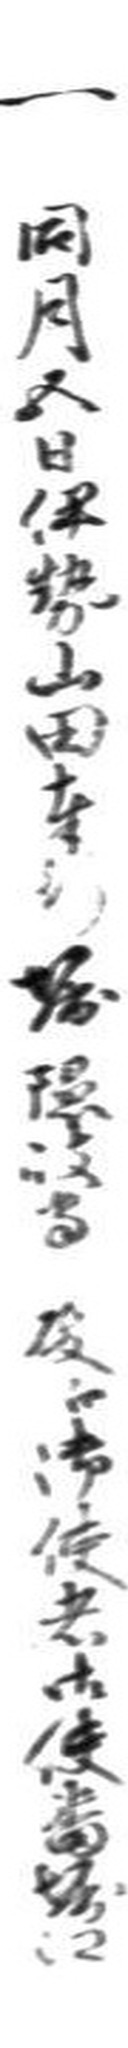一同月五日伊勢山田奉行堀隠岐守殿江御使者御使番堀江
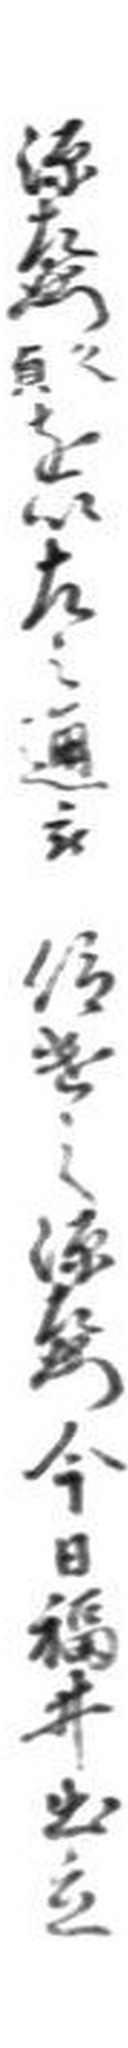貞を以左之通被仰遣之源左衛門今日福井出立
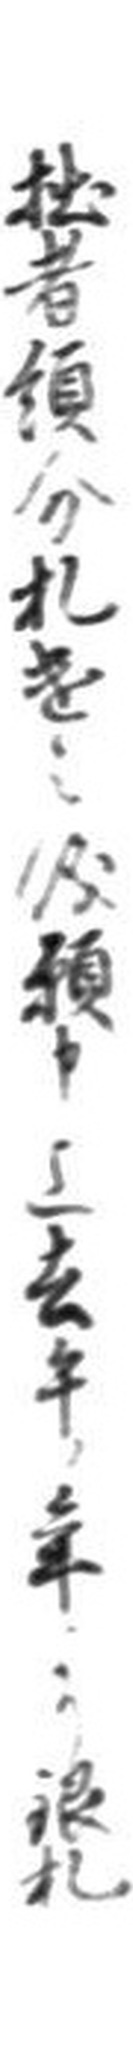拙者領分札遣之儀願申上去午ノ年より銀札
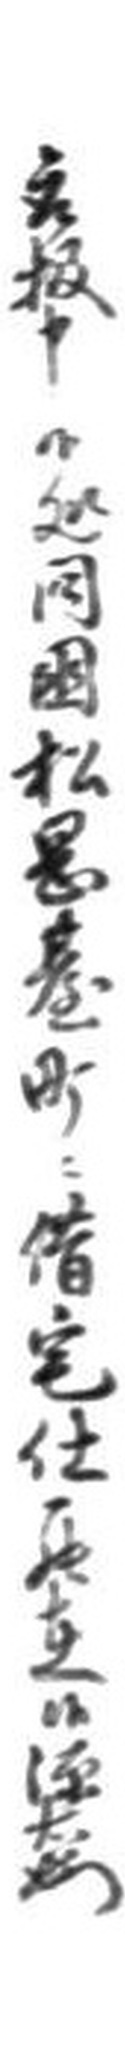取扱申候同国松岡台町ニ借宅仕罷在候源右衛門
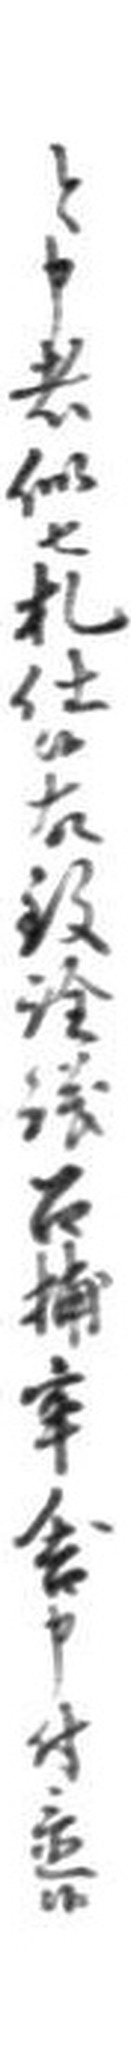と申者似セ札仕候故致詮議召捕牢舎申付置候
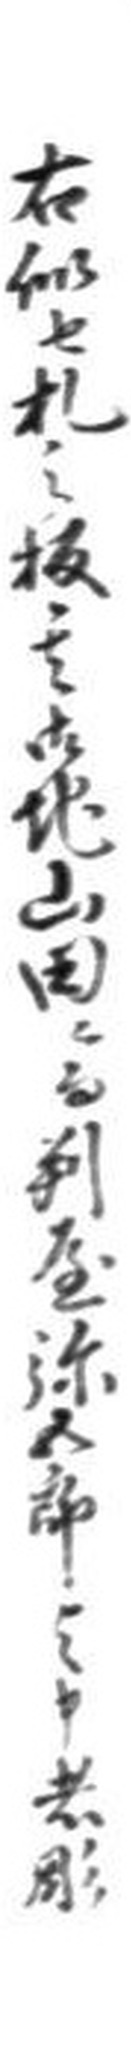右似セ札之板其御地山田ニ而判屋弥五郎与申者彫

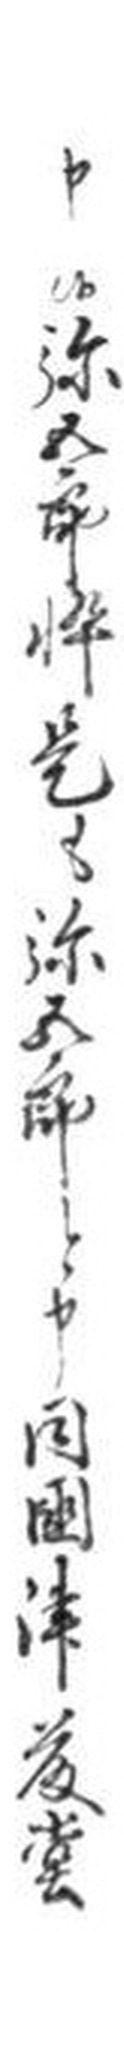申候弥五郎忰是も弥五郎と申同国津藤堂
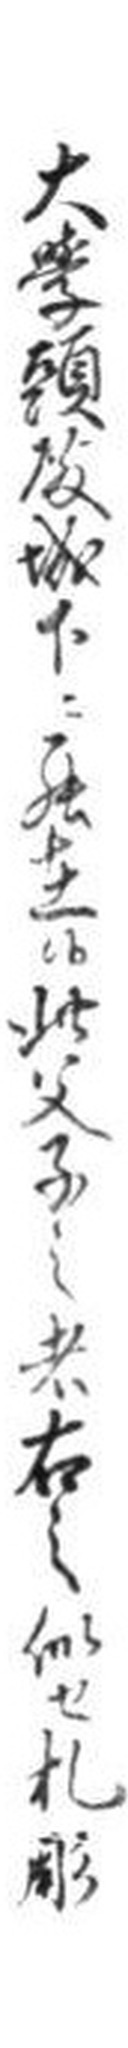大学頭殿城下ニ罷在候此父子之者右之似セ札彫
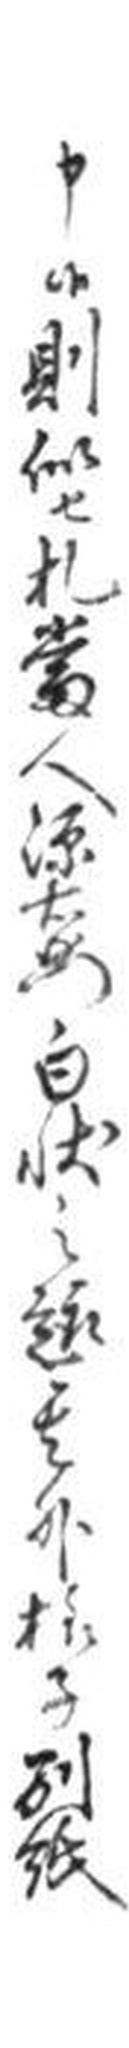申候則似セ札当人源右衛門白状之趣其外様子別紙
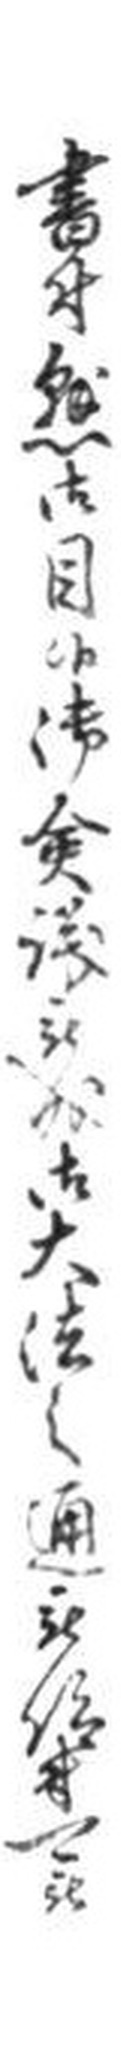書付懸御目候御僉議被成御大法之通被仰付可被
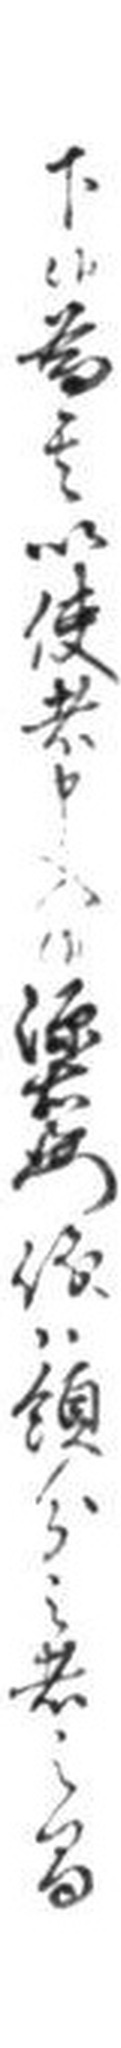下候為其以使者申入候源右衛門儀ハ領分之者ニ候間
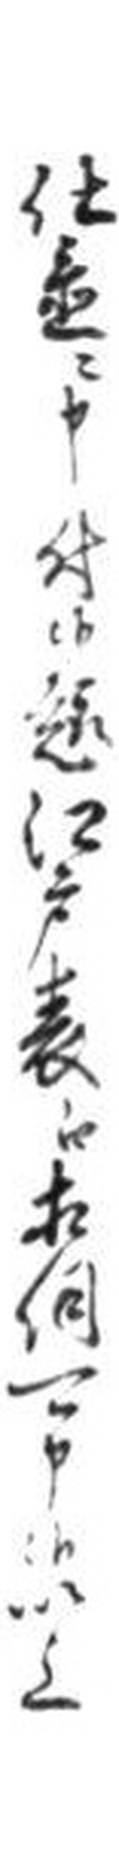仕置ニ申付候趣江戸表江相伺可申候以上
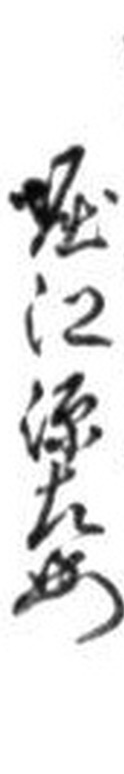堀江源左衛門
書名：家譜 二十二 吉品公 従元禄十五年到同十六年
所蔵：福井県文書館 Fukui Prefectural Archives
